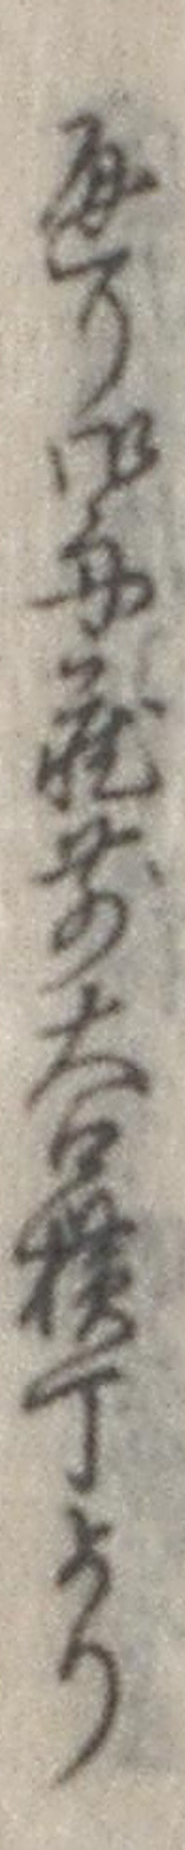通り御船蔵前大口横丁より
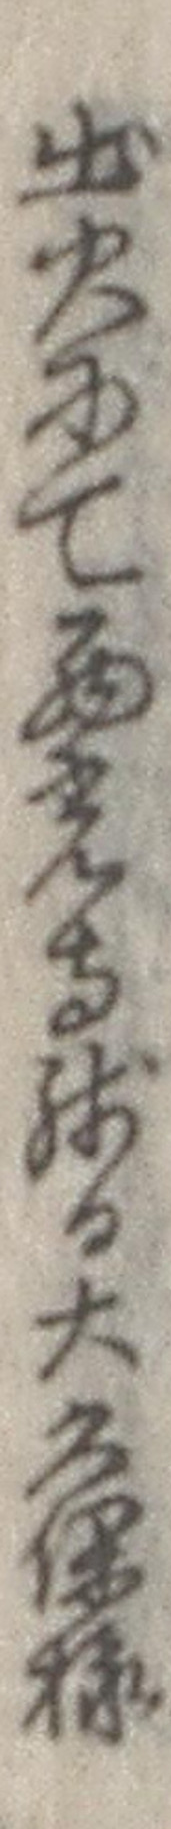出火にて西光寺残る大久保様
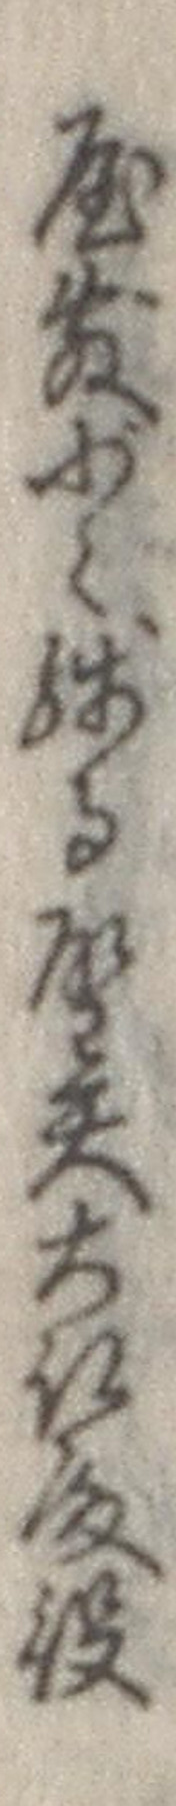家敷少〻残る聖天大社殿役
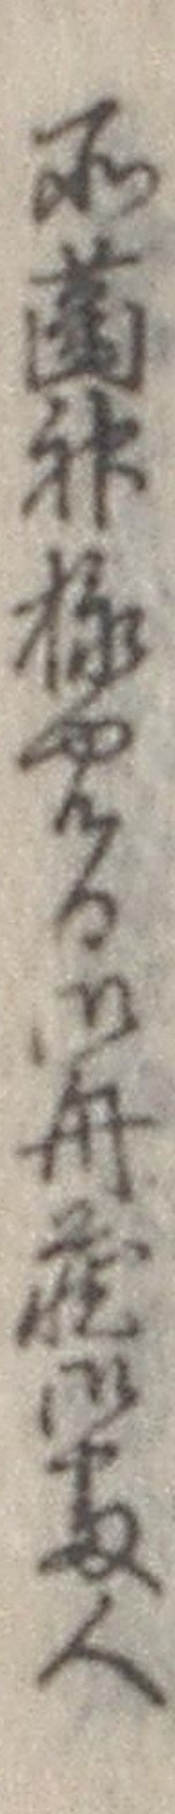所萬神様やける御船蔵御番人
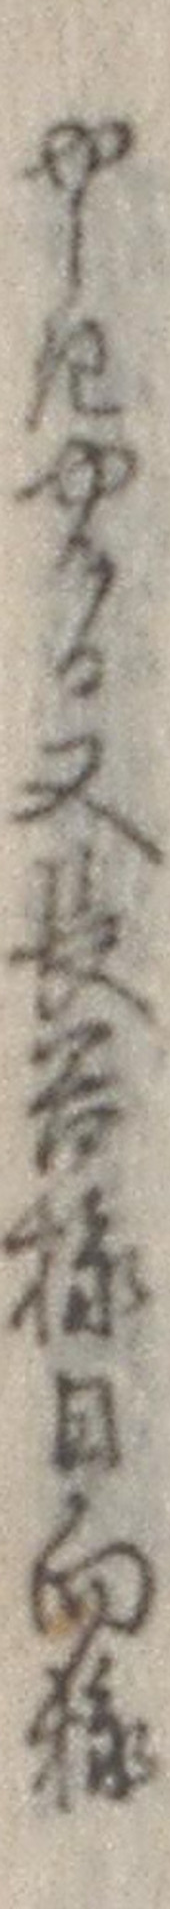やしきやける又長谷様日向様
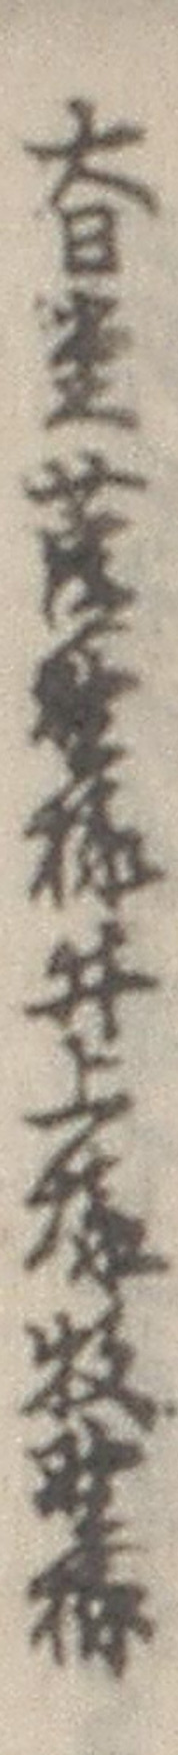大日堂茂野様井上様牧野様
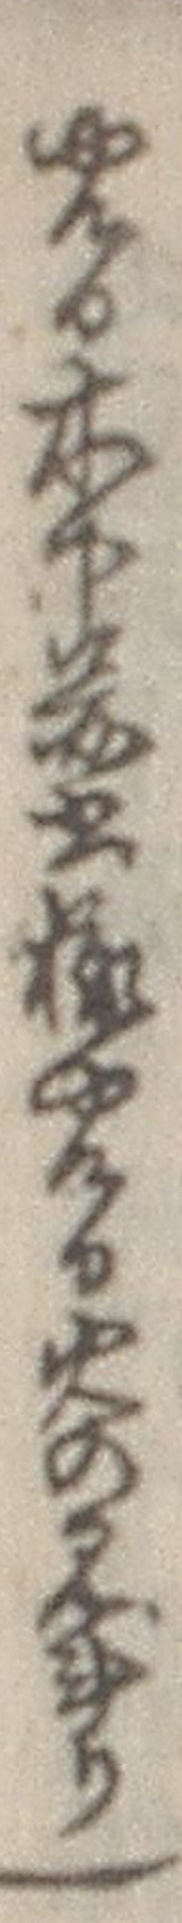やける木下図書様やける火の見計り
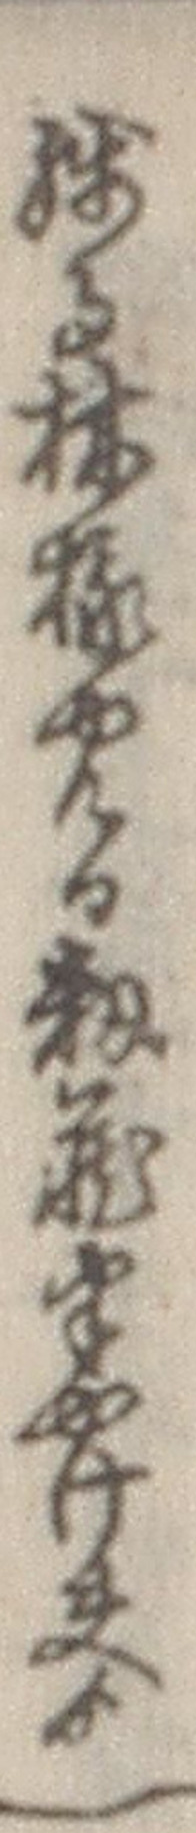残る林様やける籾蔵半やけ夫ゟ
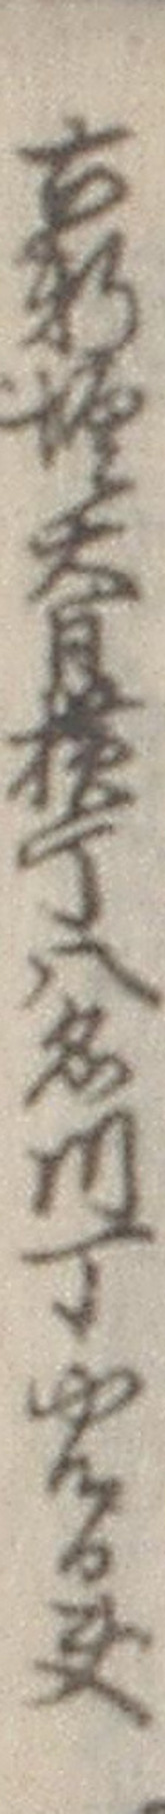六軒堀大月横丁八名川丁やける夫
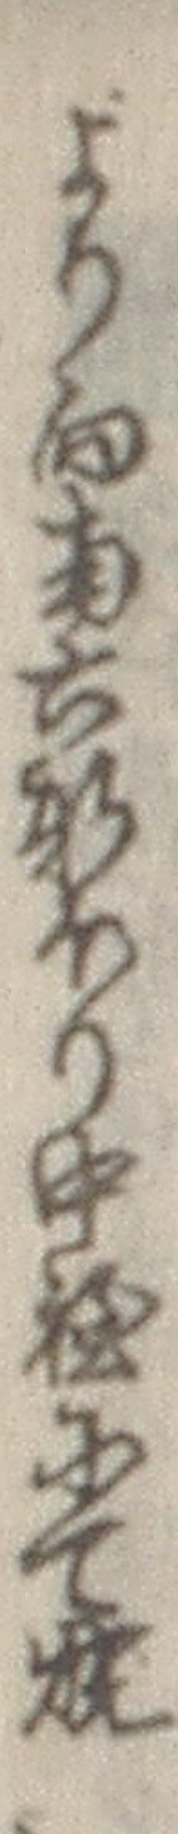より向南六軒ほり中程にて焼
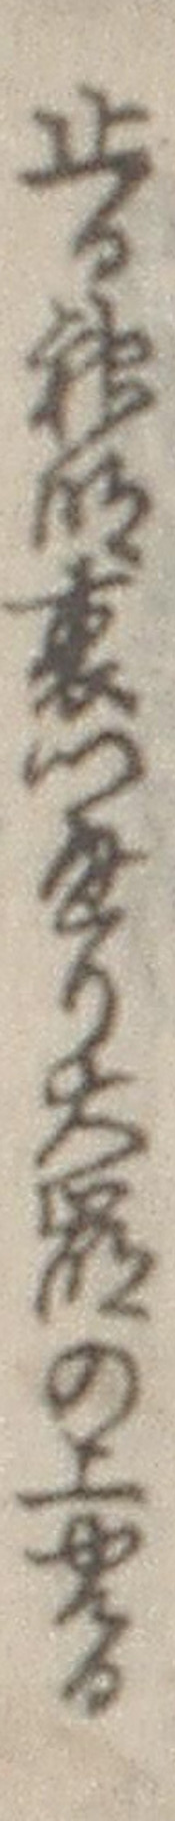止る神明裏門通り大崩の上やける
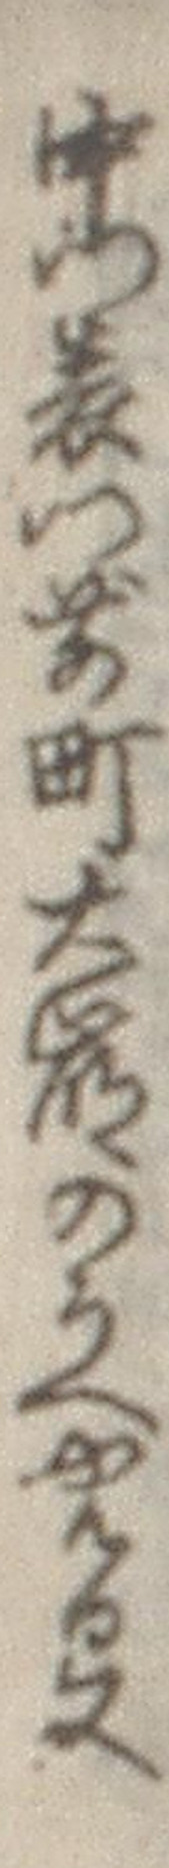中門表門前町大崩のうへやける又
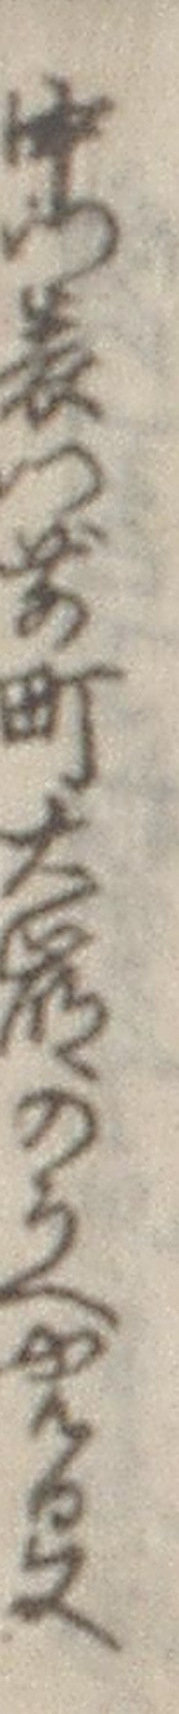中門表門前町大崩のうへやける又
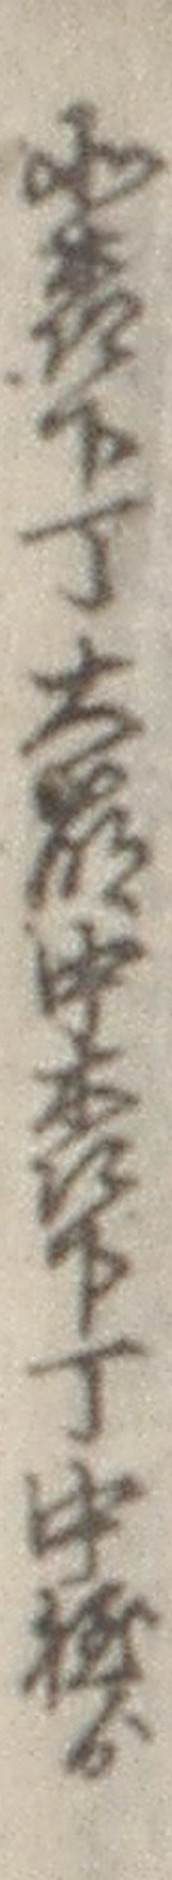北森下丁大崩中森下丁中程ゟ
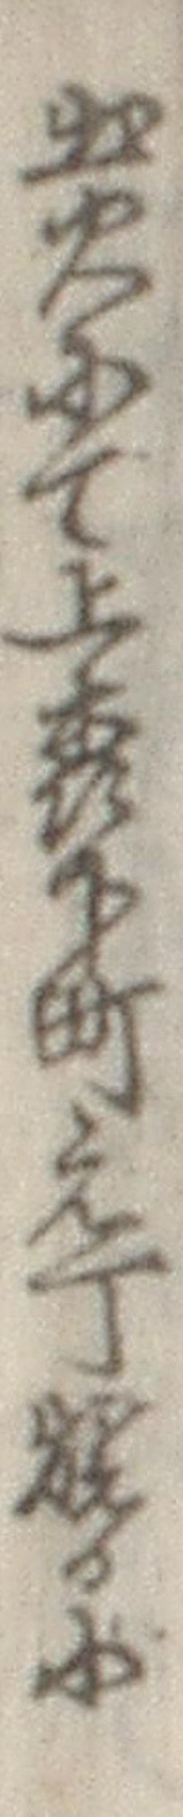出火にて上森下町元丁焼る小
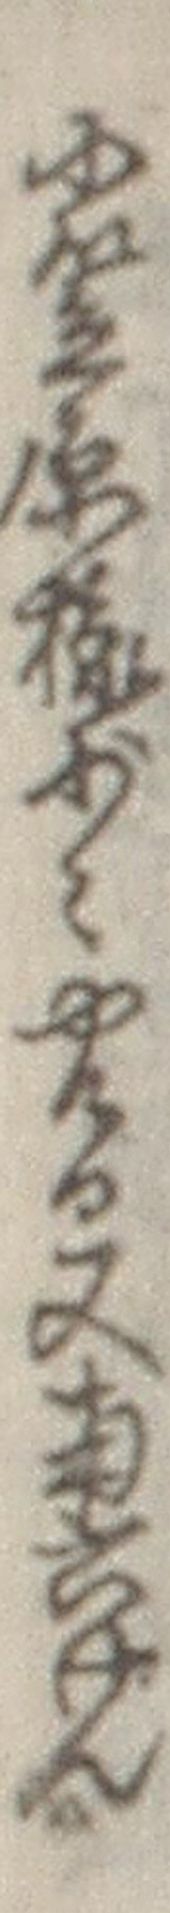小笠原様少〻やける又南六けん
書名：江戸　大地震臣細録　全
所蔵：東京大学地震研究所図書室 Earthquake Research Institute Library, The University of Tokyo, JAPAN
